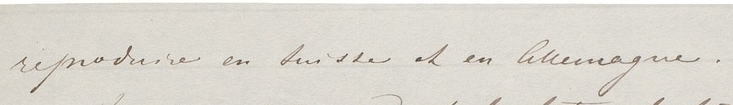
reproduire en Suisse et en Allemagne.
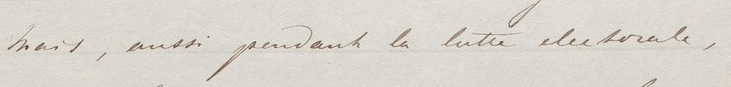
Mais, aussi pendant la lutte electorale,
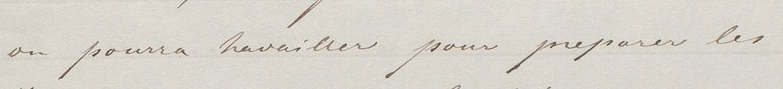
on pourra travailler pour preparer les
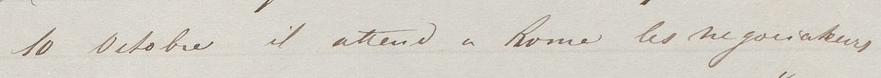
10 Octobre il attend a Rome les negociateurs
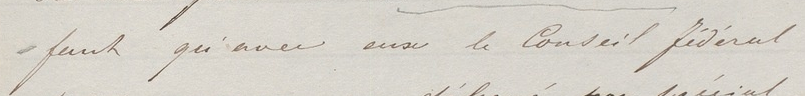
faut qu'avec eux le Conseil Fédéral
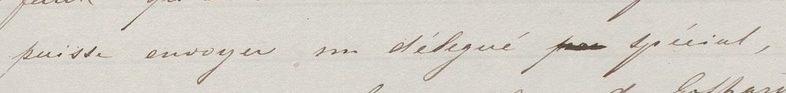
puisse envoyer un délegué pou spécial,
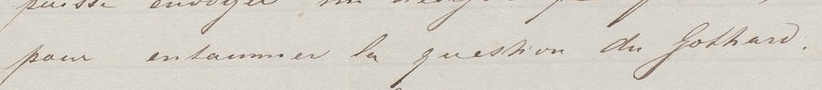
pour entammer la question du Gothard.
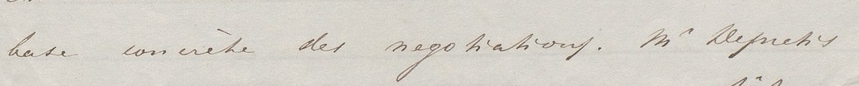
base concrète des negotiations. MrDepretis
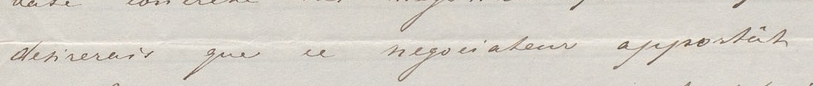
desirerais que ce negociateur apportait
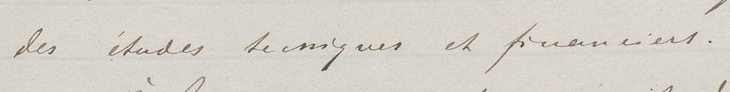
des études tecniques et financiers.
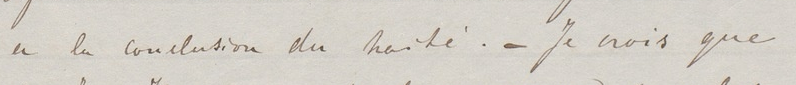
a la conclusion du traité. – Je crois que
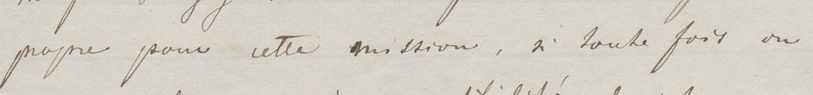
propre pour cette mission, si toute fois on
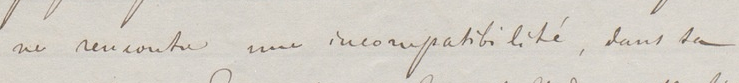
ne rencontre une incompatibilité, dans sa
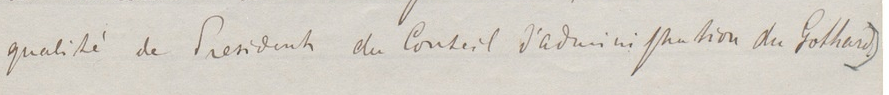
qualité de President du Conseil d'administration du Gothard.
